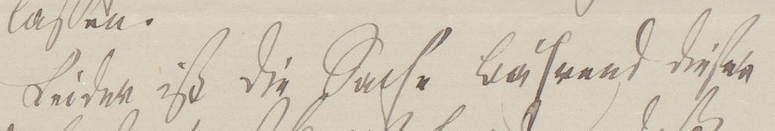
Leider ist die Sache während dieser
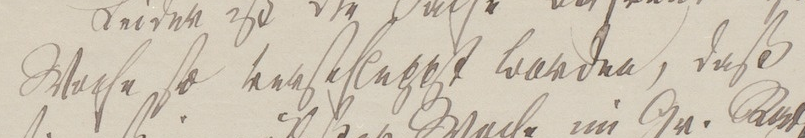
Woche so verschleppt worden, daß
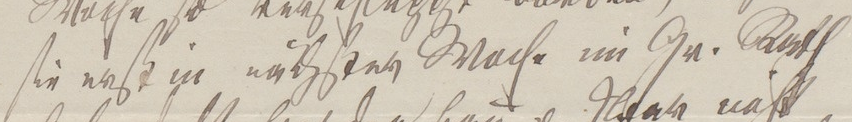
sie erst in nächster Woche im Gr. Rath
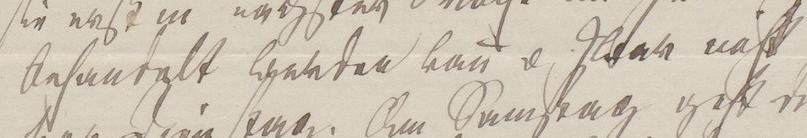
behandelt werden kann & zwar nicht
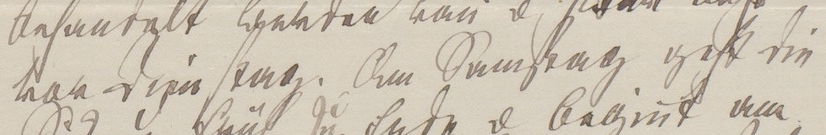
vor Dienstag. Am Samstag geht die
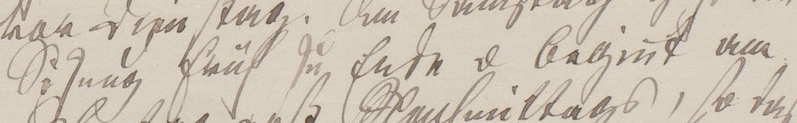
Sitzung früh zu Ende & beginnt am
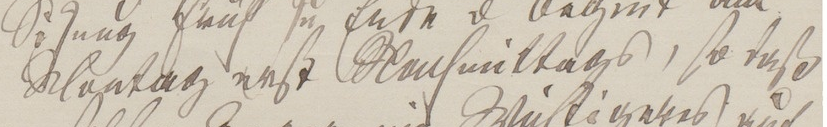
Montag erst Nachmittags, so daß
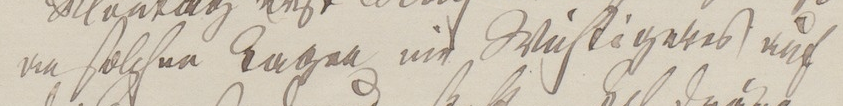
an solchen Tagen nie Wichtigeres auf
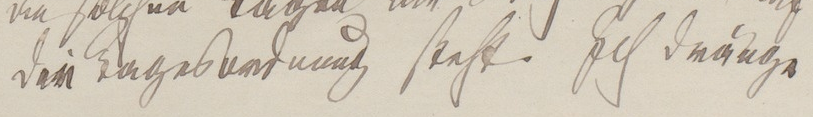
der Tagesordnung steht. Ich dränge
